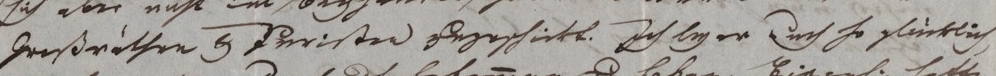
Großräthen & Juristen zugeschickt. Ich war auch so glücklich,
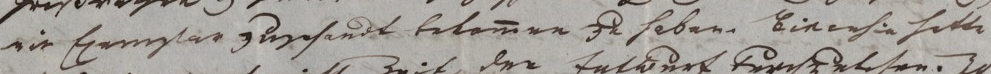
ein Exemplar zugesandt bekommen zu haben. Bis anhin hatte
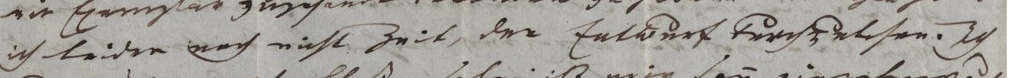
ich leider noch nicht Zeit, den Entwurf durchzulesen. Ich
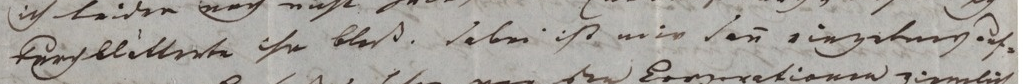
durchblätterte ihn bloß. Dabei ist mir dann einzelnes auf-
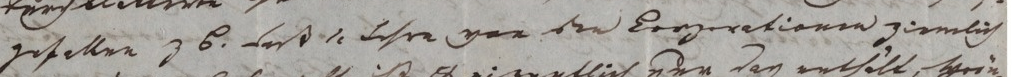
gefallen, z. B. d. Lehre von den Coorperationen ziemlich
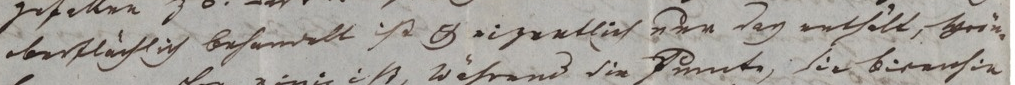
oberflächlich behandelt ist, &eigentlich nur das enthält; worü-
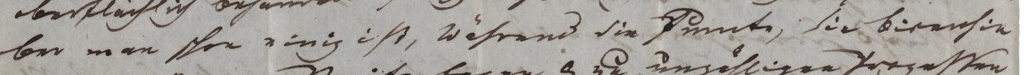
ber man schon einig ist, während die Puncte, die bisanhin
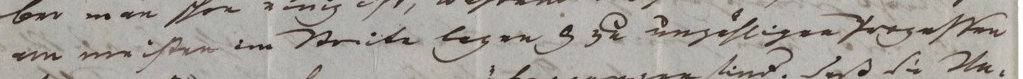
am meisten im Streite lagen & zu unzähligen Prozessen
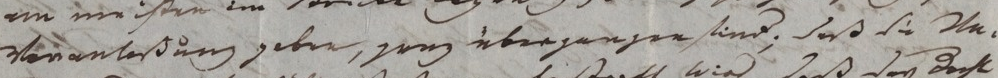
Veranlaßung gaben, ganz übergangen sind; daß die Un-
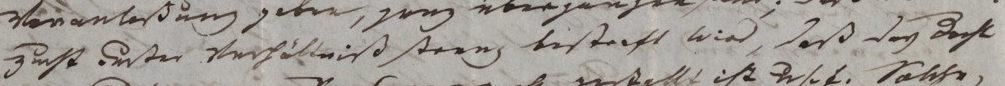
zucht außer Verhältniß streng bestraft wird, daß das Recht
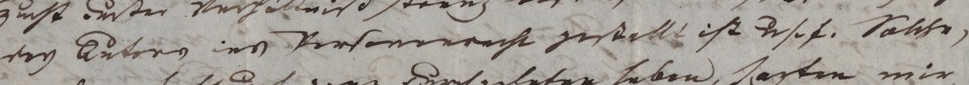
des Autors ins Personenrecht gestellt ist u. s. f. Solche,
